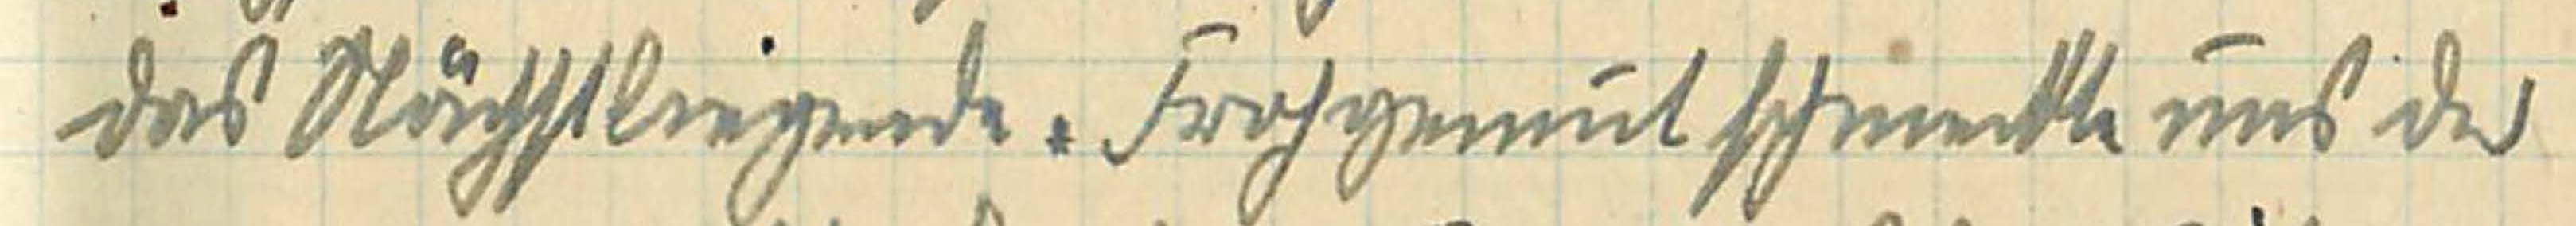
das Nächstliegende. Frohgemut schmeckte uns der
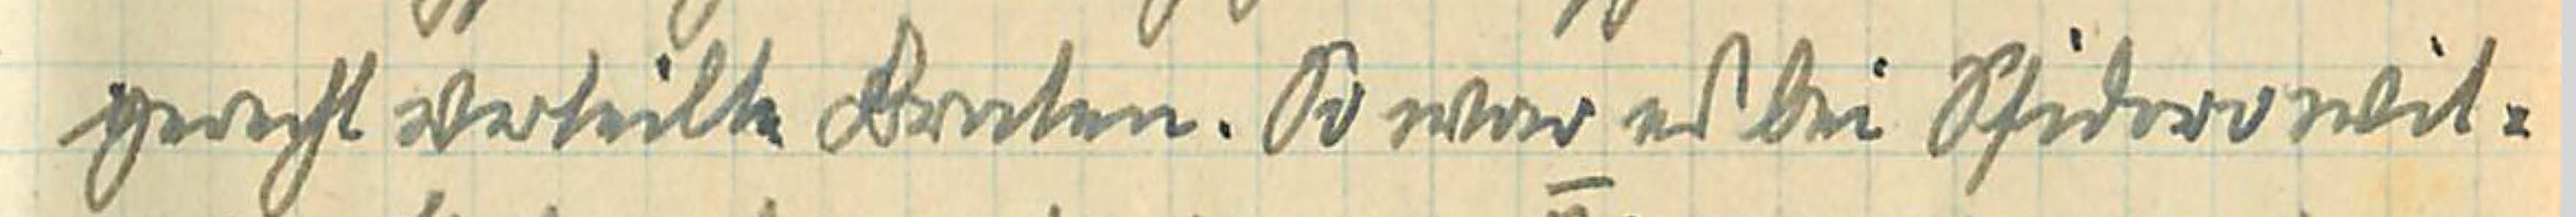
gerecht verteilte Braten. So war es bei Sfidorowit-
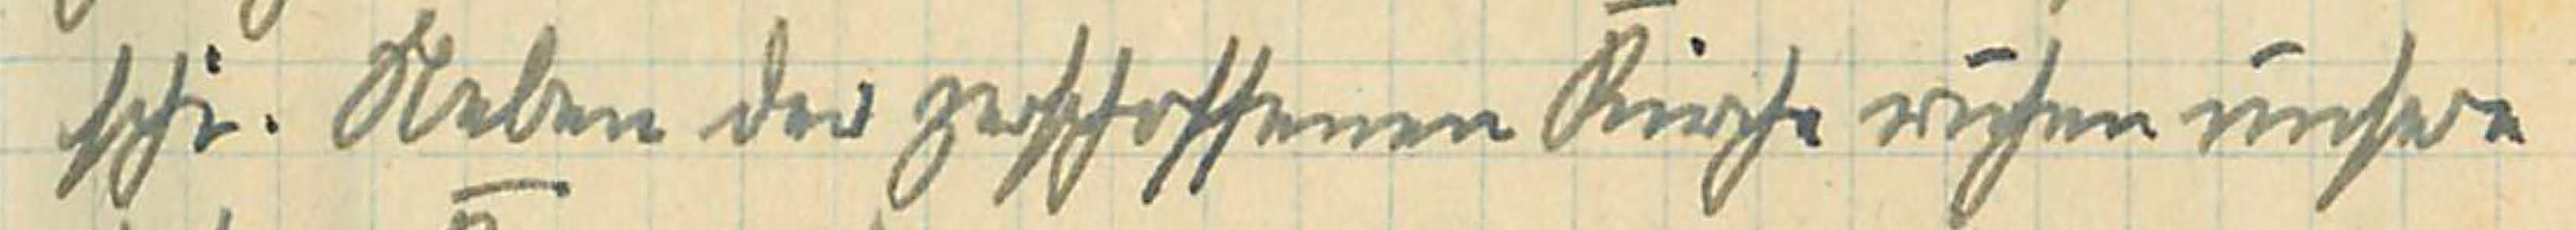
schi. Neben der zerschossenen Kirche ruhen unsere
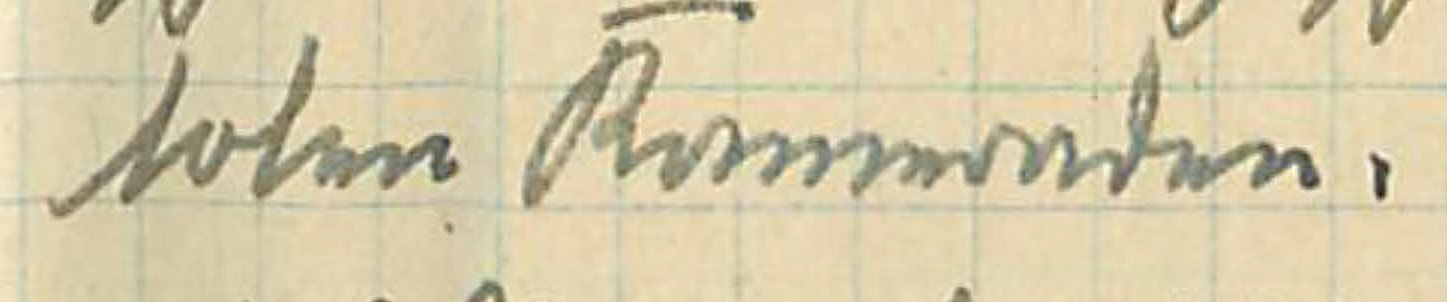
toten Kameraden.
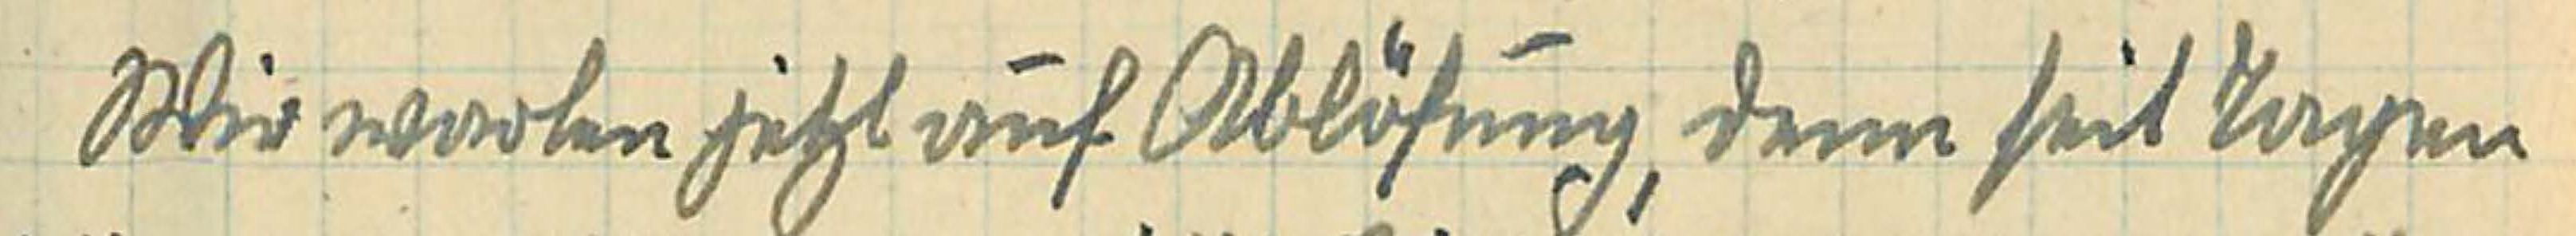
Wir warten jetzt auf Ablösung, denn seit Tagen
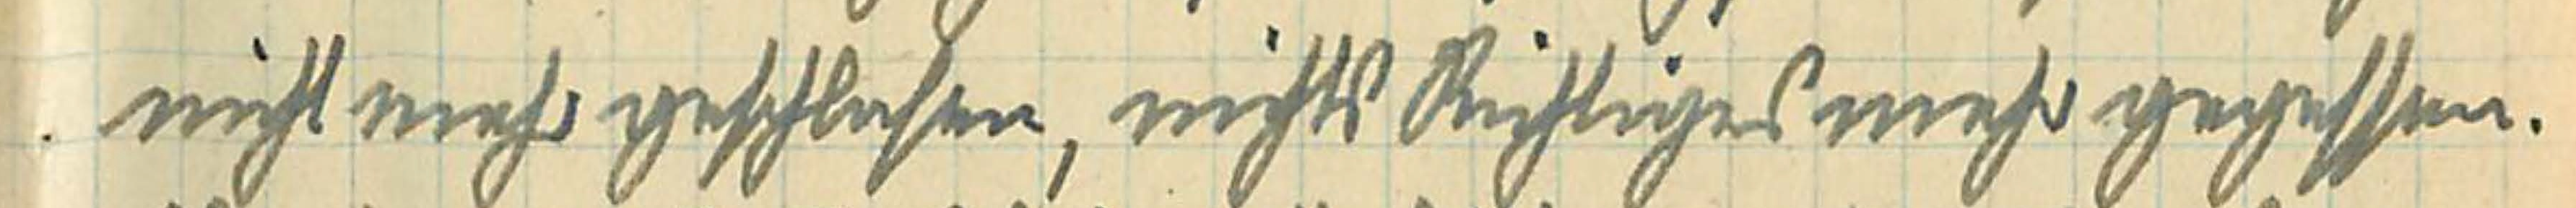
nicht mehr geschlafen, nichts Richtiges mehr gegessen.
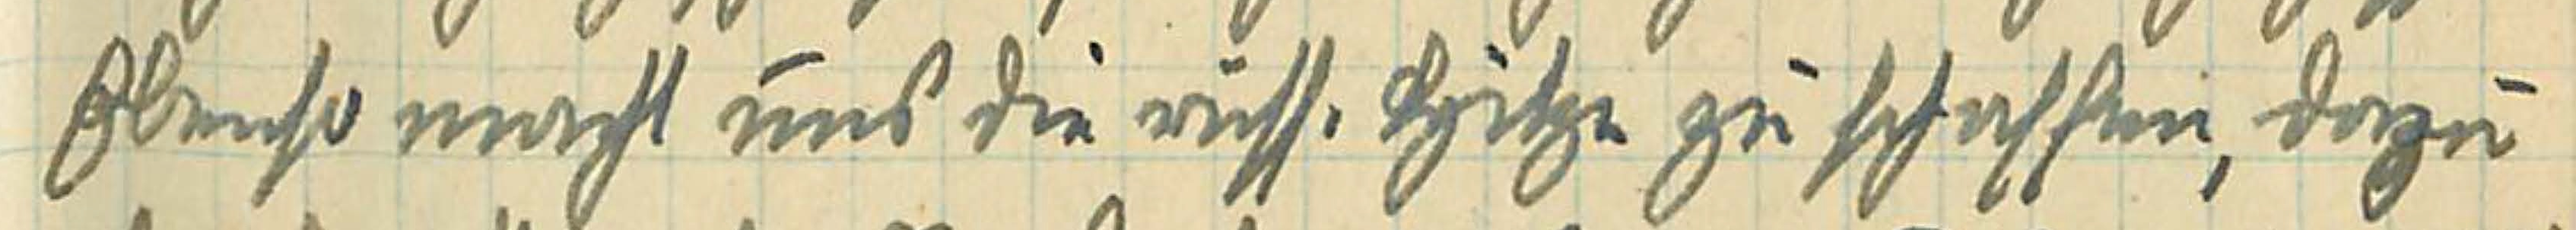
Ebenso macht uns die russ. Hitze zu schaffen, dazu
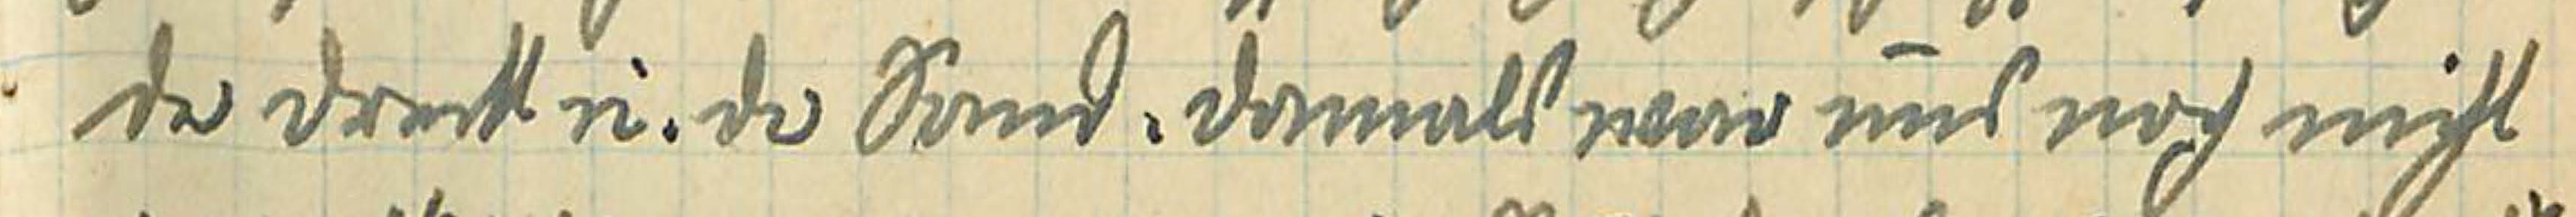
der Dreck u. der Sand. Damals war uns noch nicht
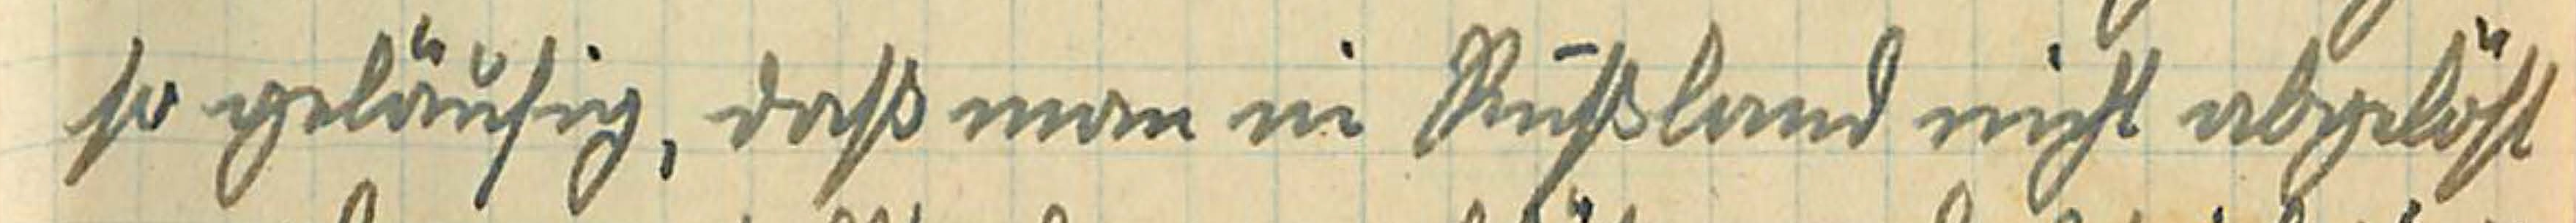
so geläufig, daß man in Rußland nicht abgelöst
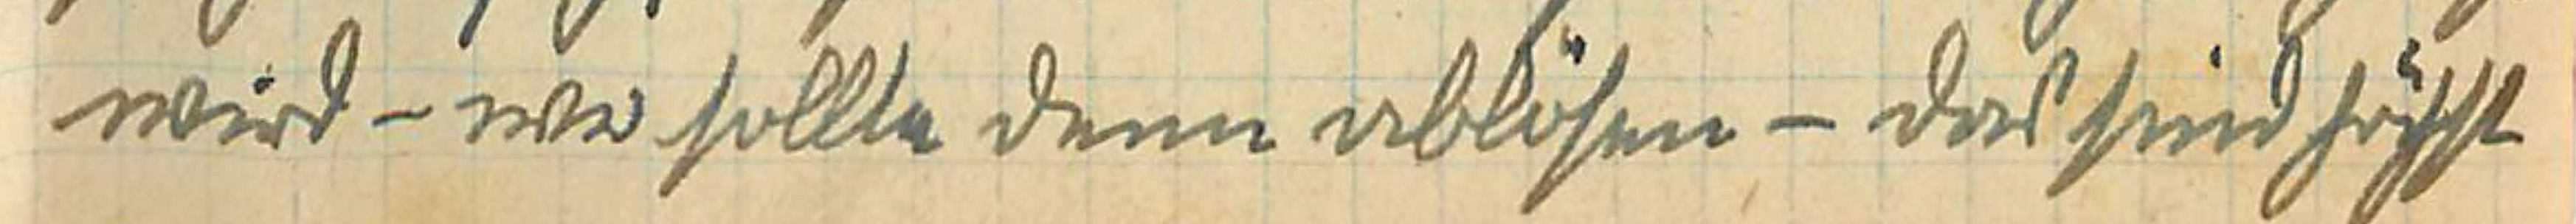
wird – wer sollte denn ablösen – das sind höchst
